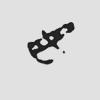母
